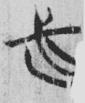必
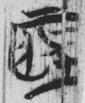聖（聽）
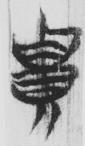貴
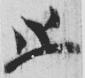之
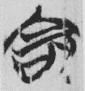命
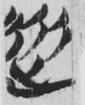從
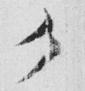人
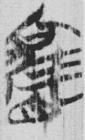觀（勸）
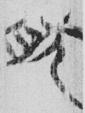肰（然）
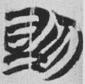則
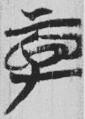○（免）
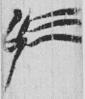於
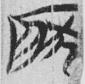戾
